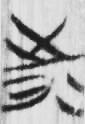之日
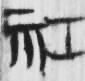{示工}（攻）
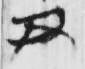尹
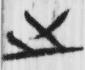之
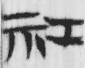{示工}（攻）
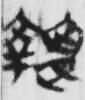執
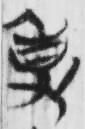事
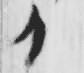人
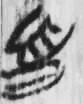○（夏）
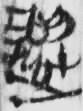○（舉）
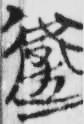衛
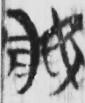妝
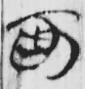爲
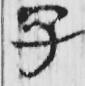子
